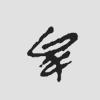夋
